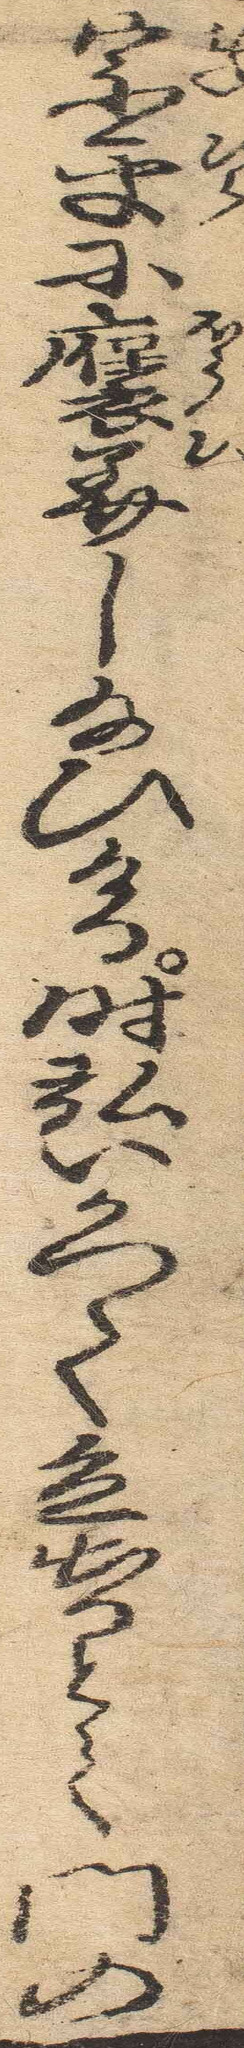宗平に褒美し給ひけり。時弘いかつて立出るとて門の
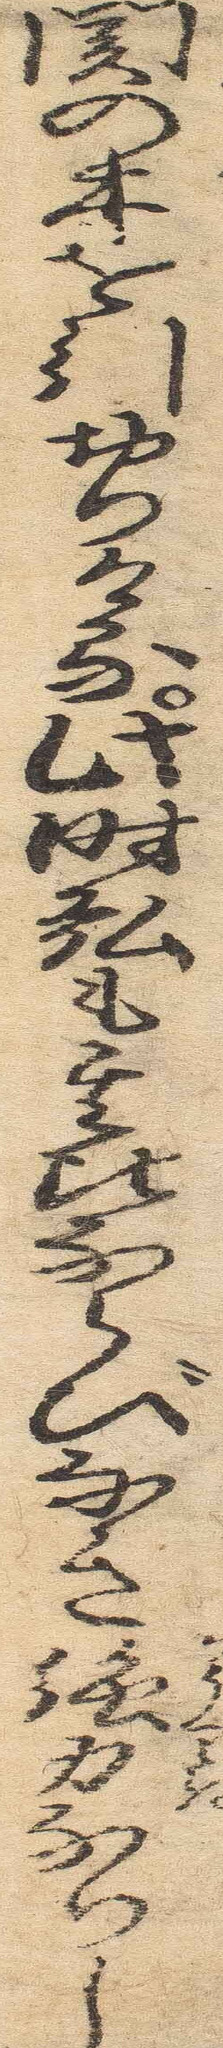関の木を引おりける。此時弘も其比ならびなき強力なりし
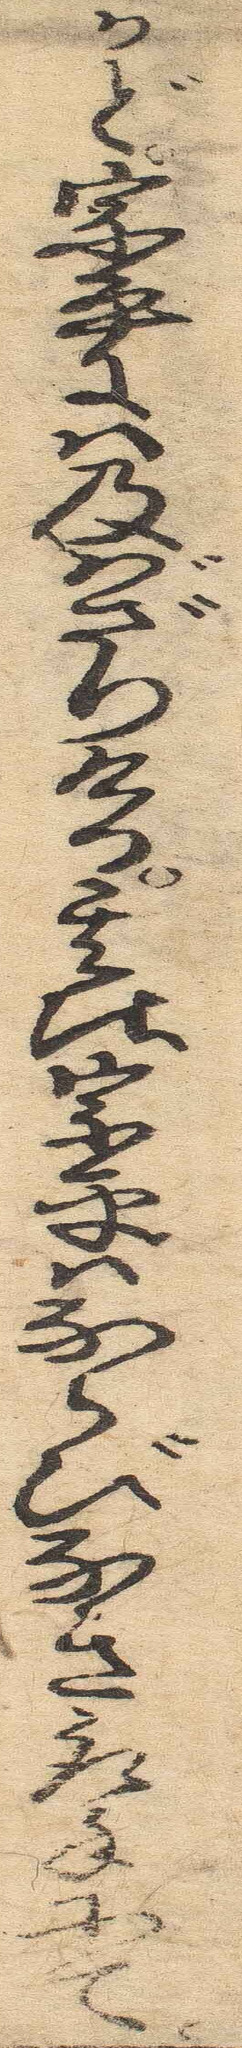かど宗平には及ばざりけり。其比宗平はならびなき取てにて
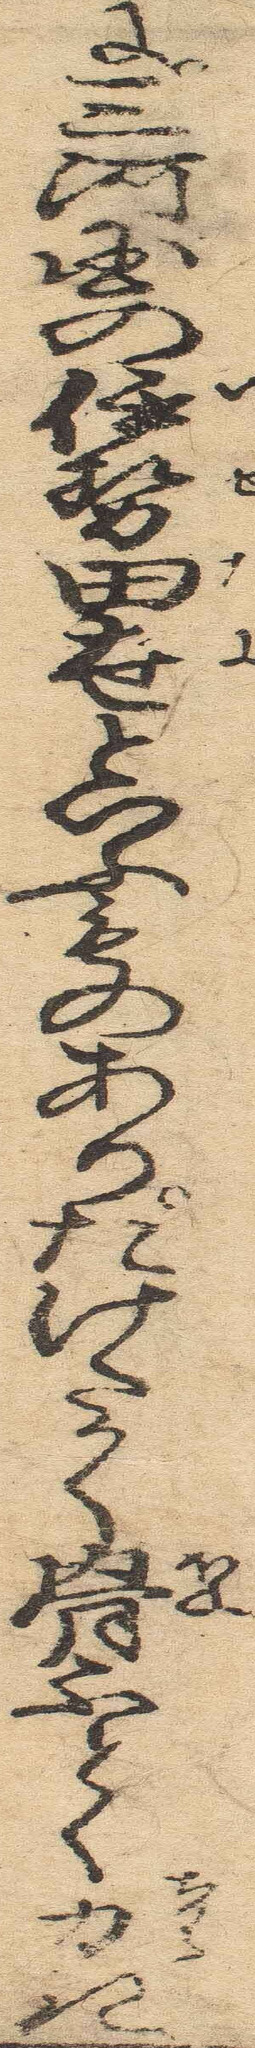に。三河国の伊勢田世といふものあり。たけたかく骨ふとく力き
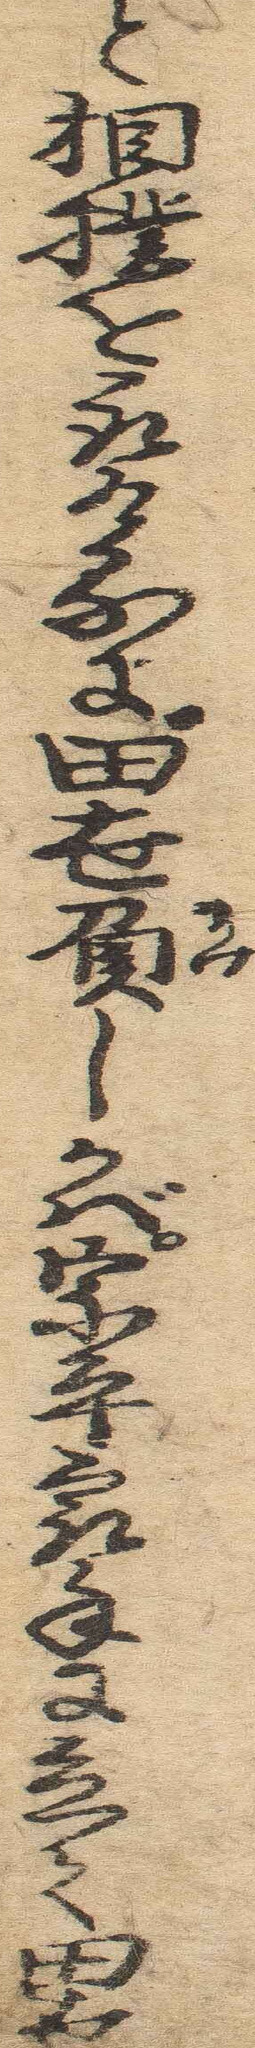と相撲を取けるに。田世負しかば。宗平最手に立て田世は
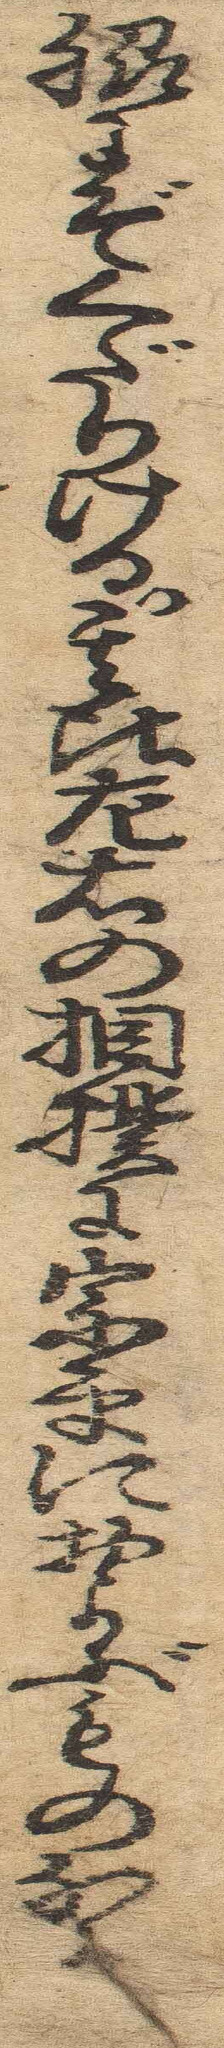脇にぞくだりける。其比左右の相撲に宗平におよぶものなかり
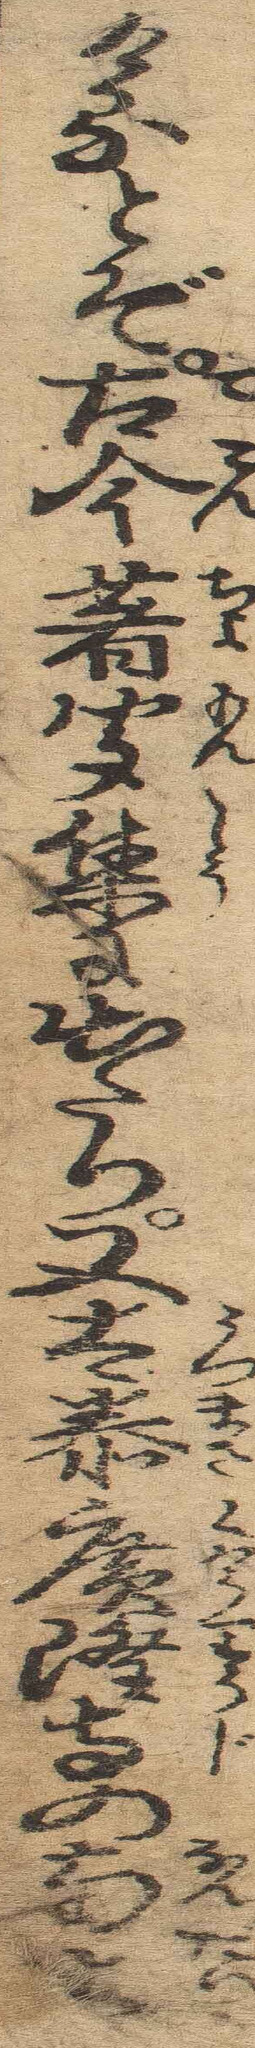けるとぞ。古今著聞集にでたり。又太秦広隆寺の南大門

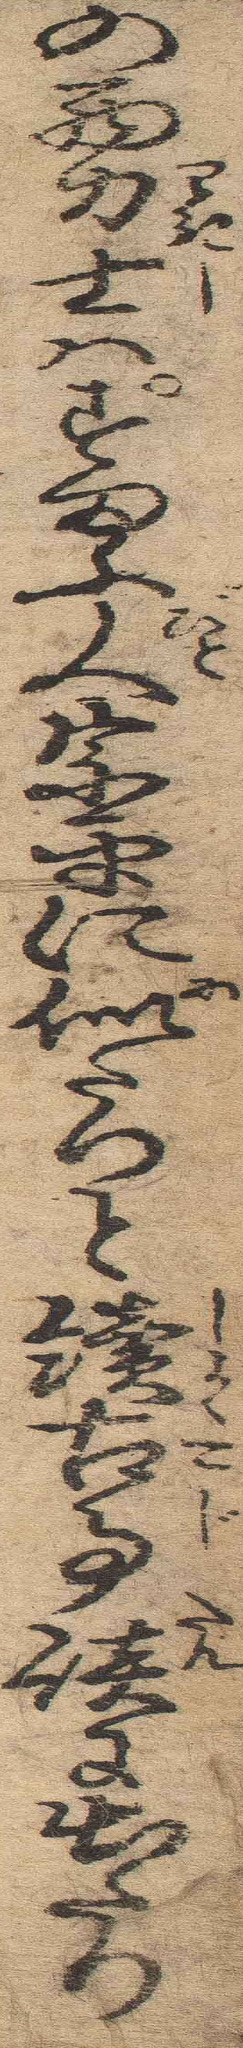の西力士は。すまふ人宗平に似たりと続古事談に出たり
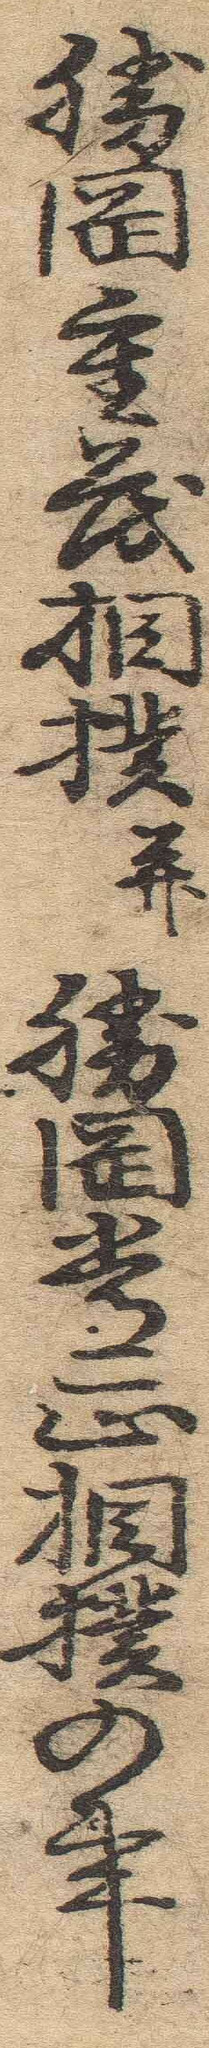勝岡重茂相撲并勝岡常正相撲の事
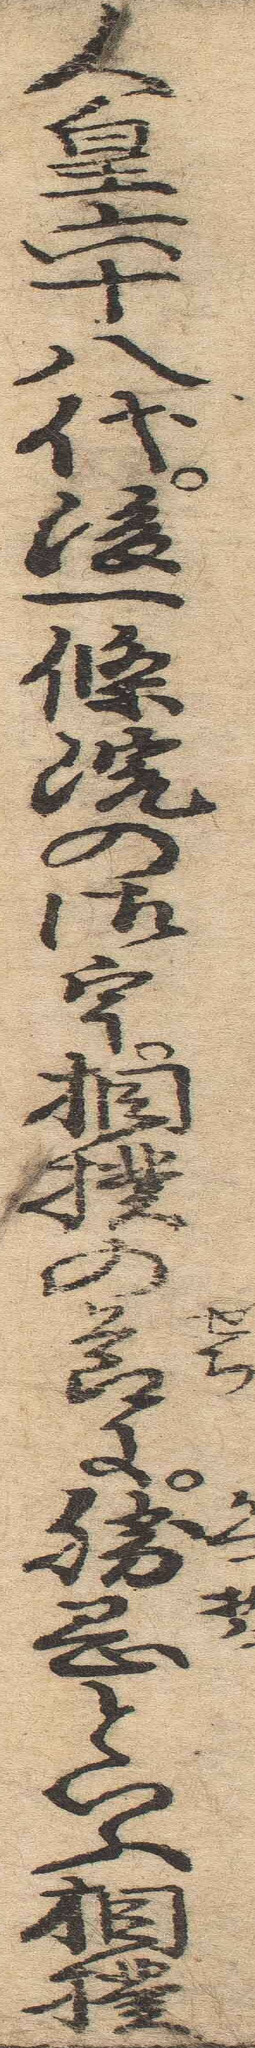人皇六十八代後一條院の御宇相撲の節に勝岡といふ相撲
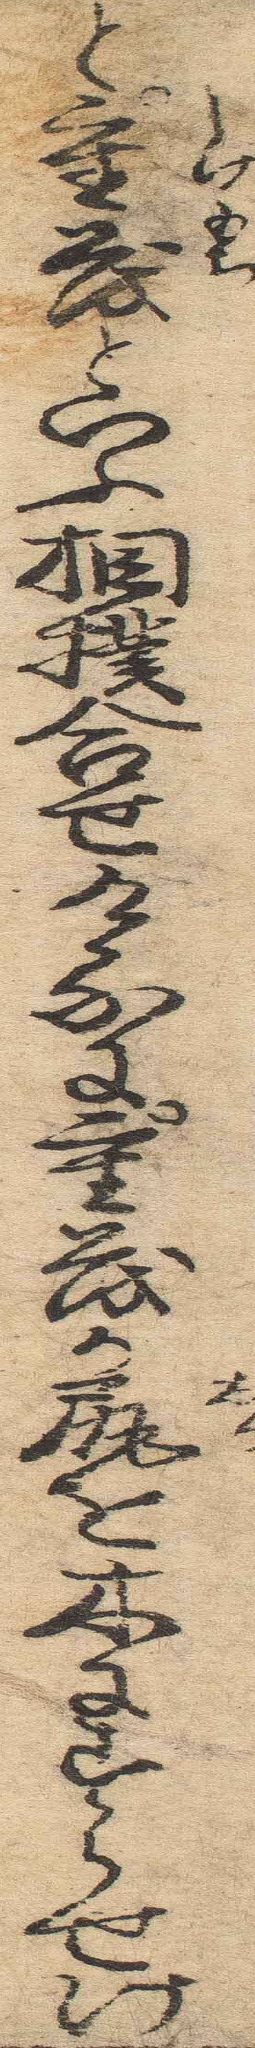と重茂といふ相撲合せけるに。重茂か尻を木にすらせけ
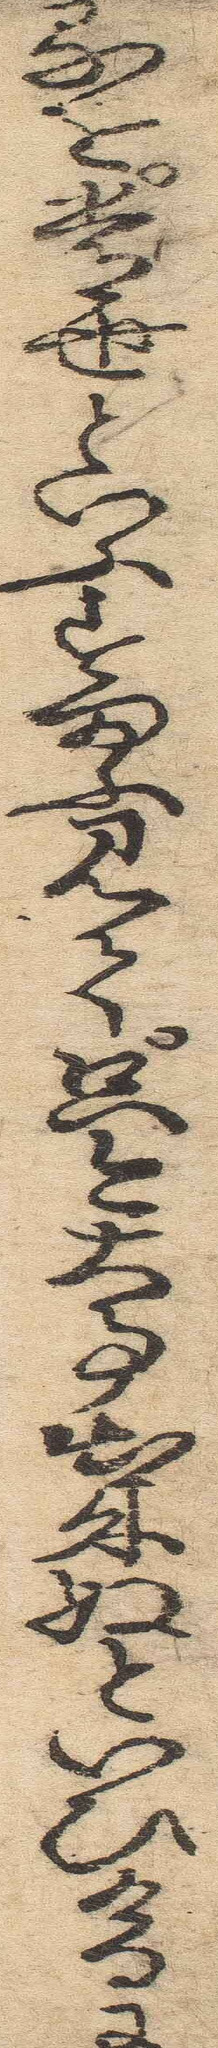るを。常世といふすまふ見て。只今大事出来ぬといひけるに
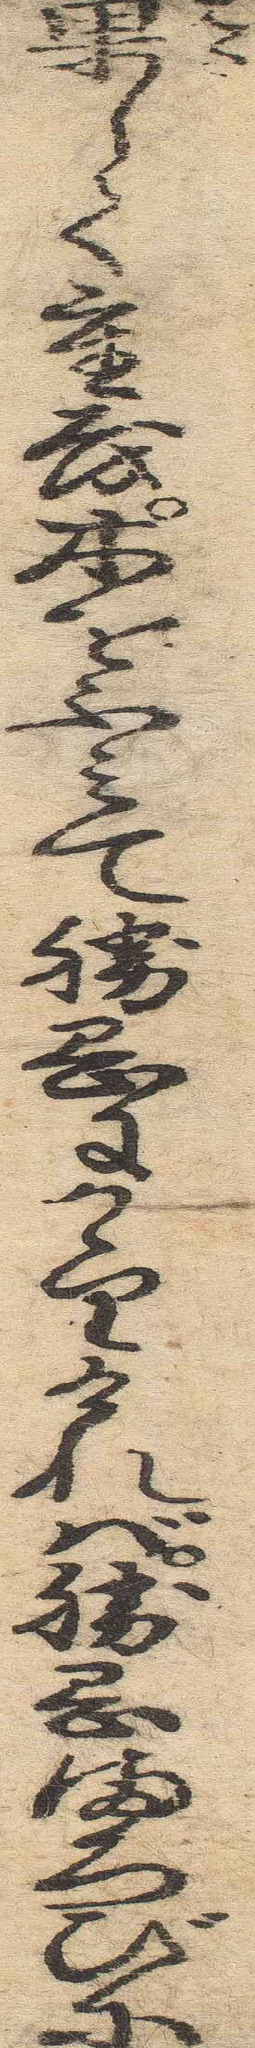果して重茂。木をふみて勝岡にかゝりければ。勝岡まろびに
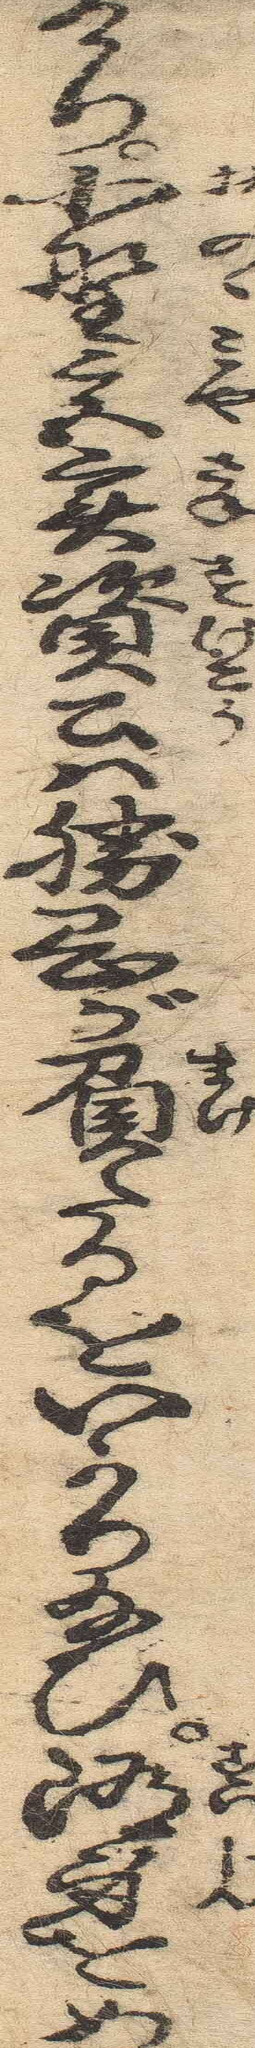けり。小野宮実資公は勝岡が負たるをいかり給ひ。隋身をめ
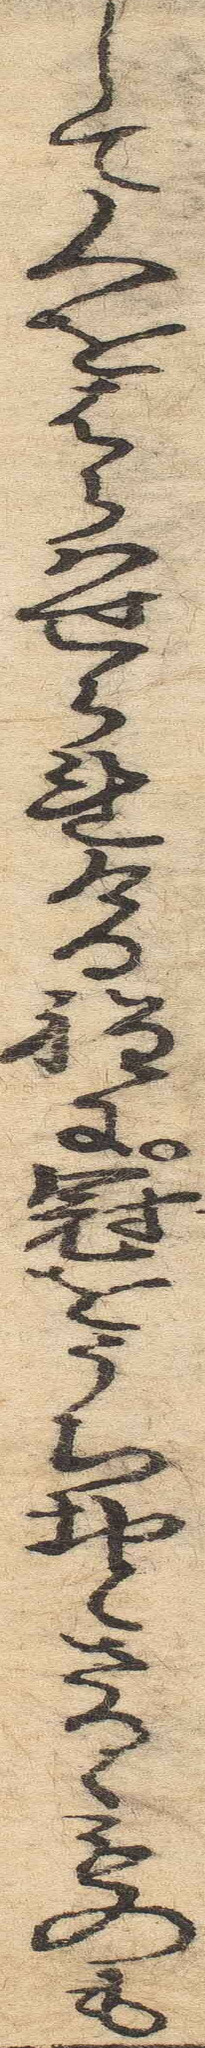して人をはらはせられける程に。冠をうちおとさるゝものも
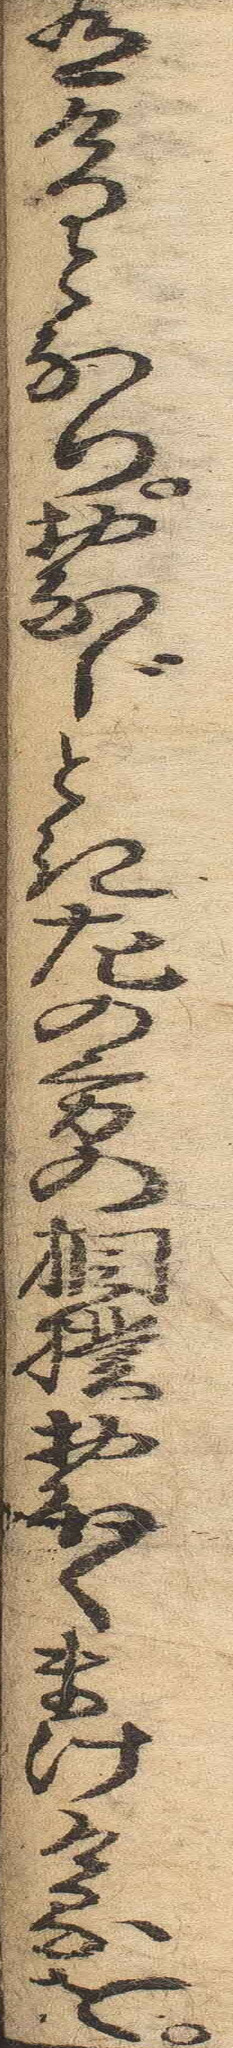有けるとなり。おなじとき左の方の相撲おめ〳〵まけけるを
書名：古今相撲大全
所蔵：東京学芸大学附属図書館 国文学研究資料館
